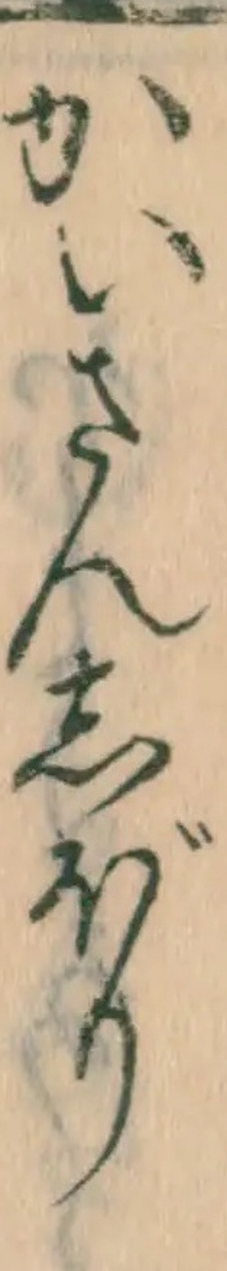かいさんしぼり
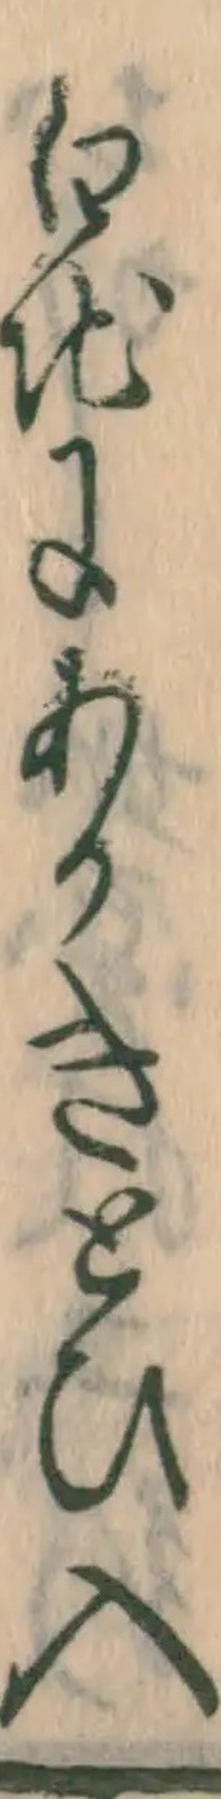白地にあかきとひ入
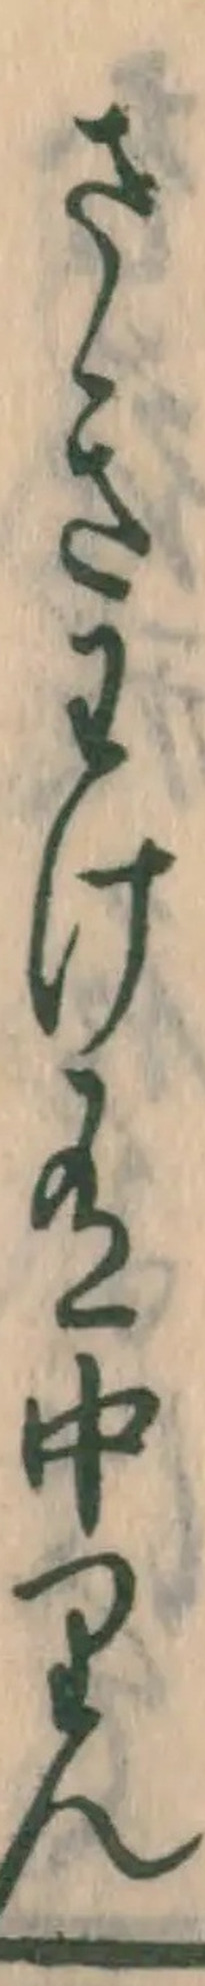さきわけ有中りん
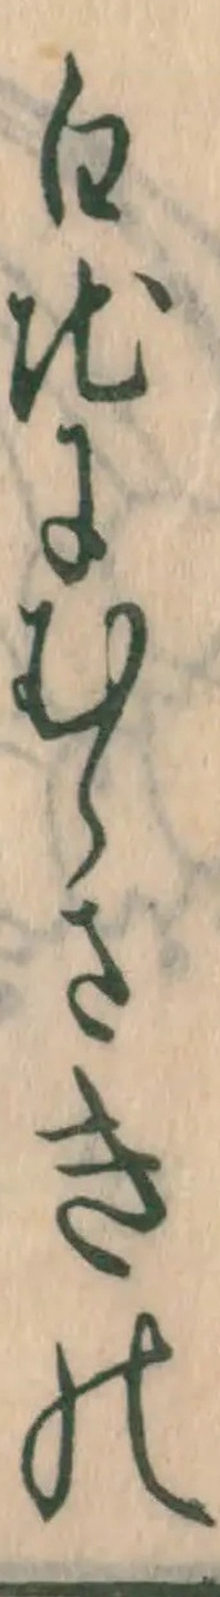白地にむらさきの
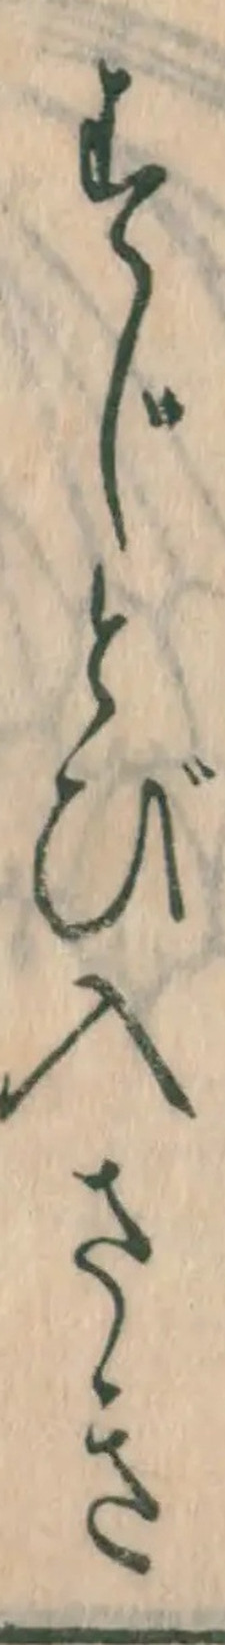すじとび入さき
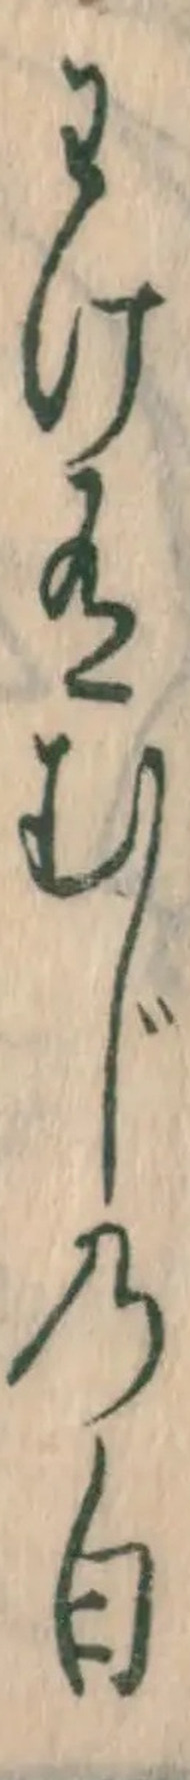わけ有むじの白
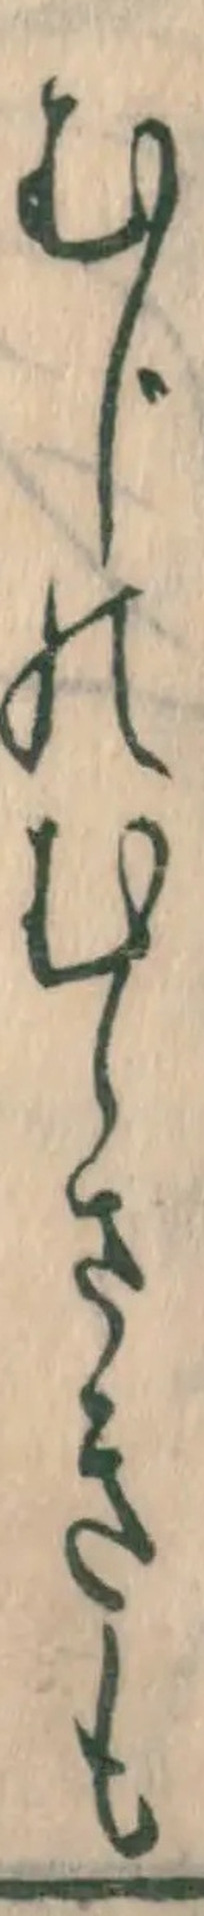むじのむらさきも
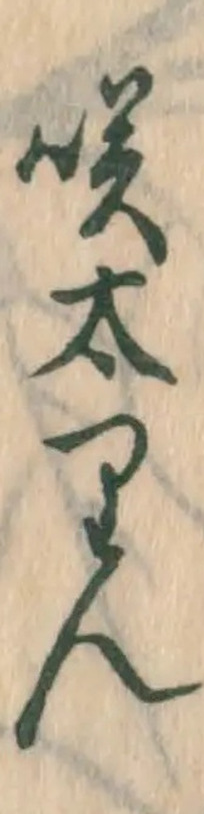咲太りん

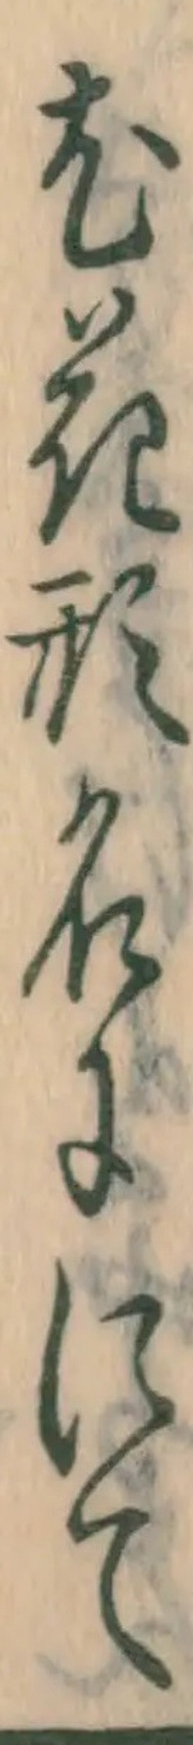尤花形名ににて
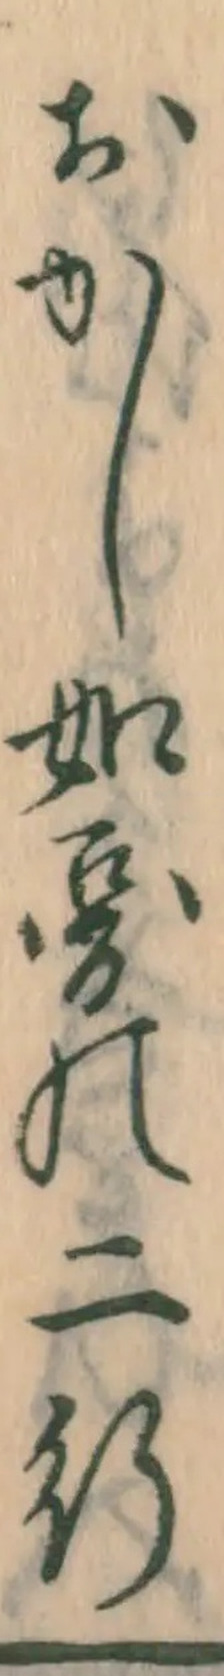おかし如図の二行
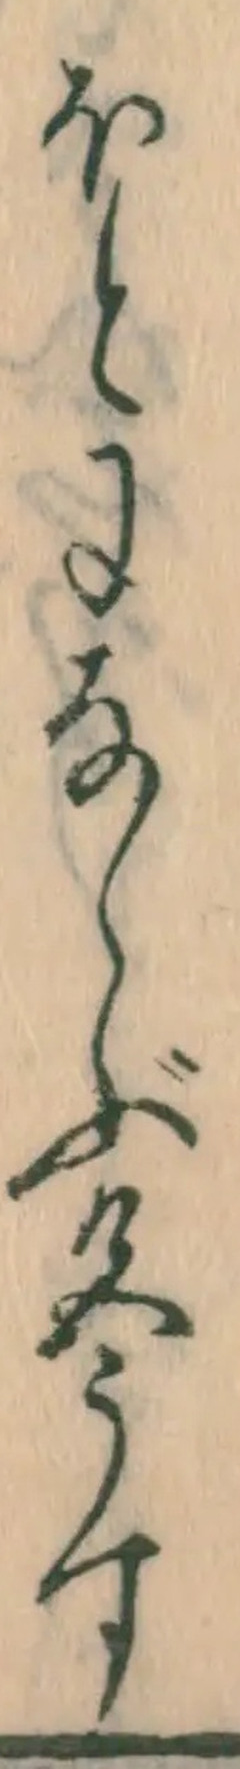ほとにならぶ色うす
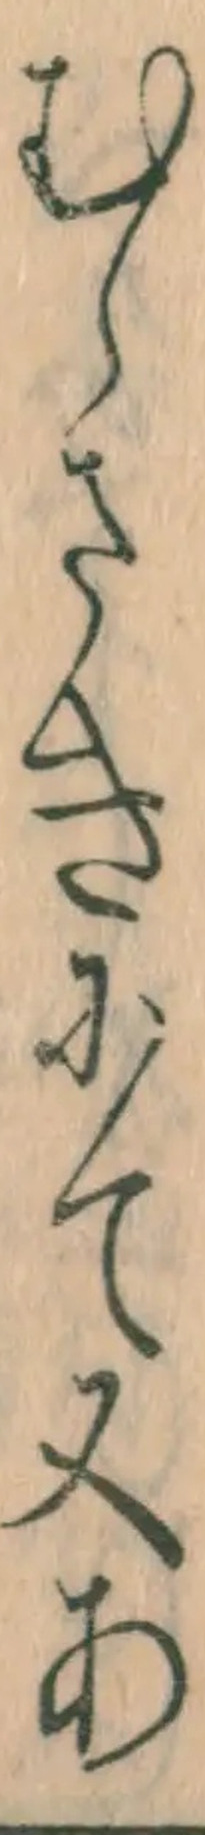むらさきにて又あ
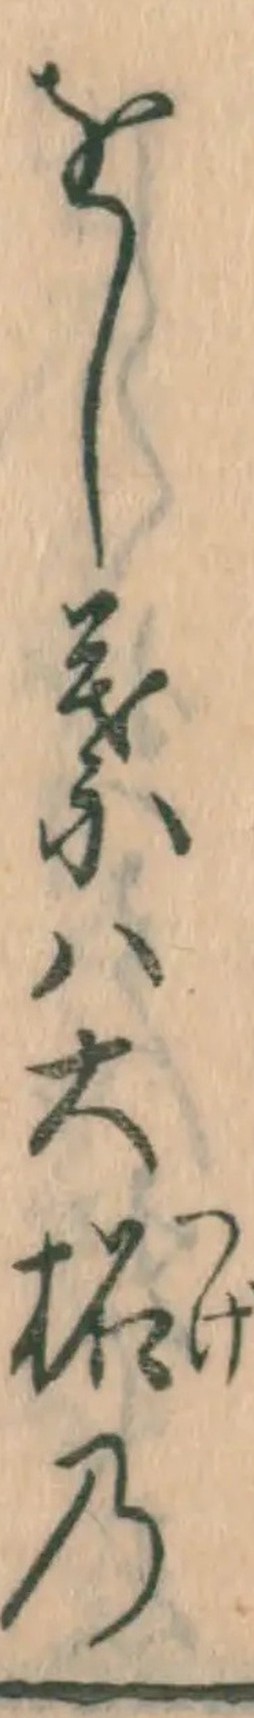をし葉は大柘の
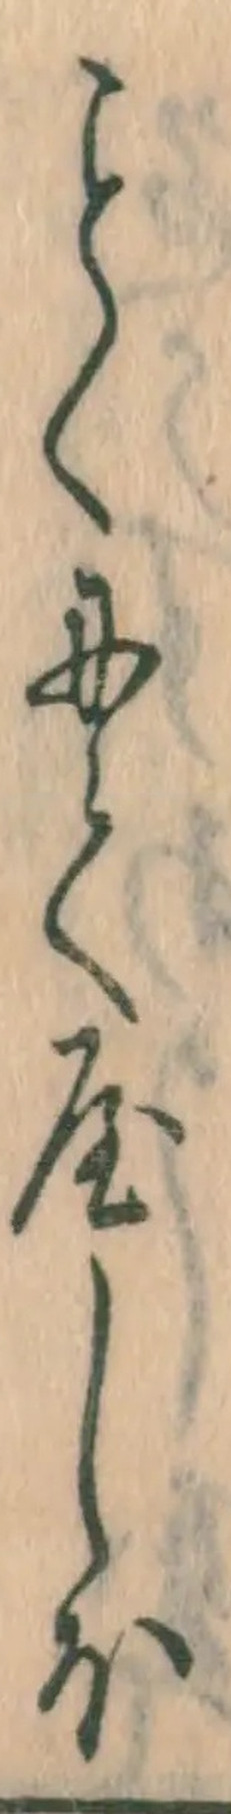ことくにてやしほ
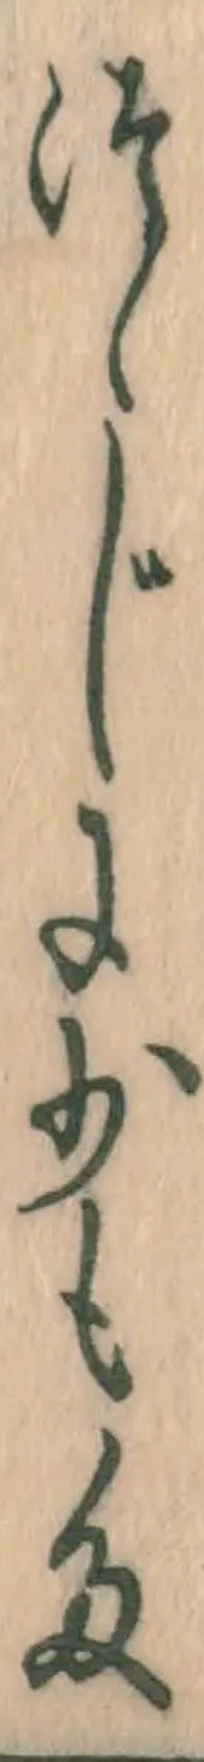つゝじに少もた
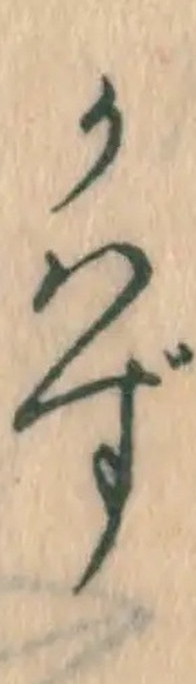かはず
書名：錦繍枕 5巻. [2]
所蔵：国立国会図書館 National Diet Library, JAPAN
